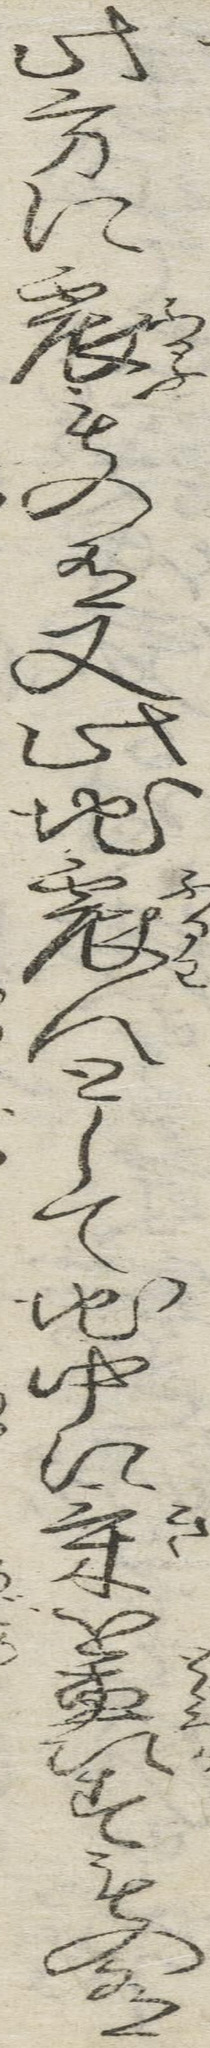此方に震もの有又此地震んとして地中に気を軣すもの有
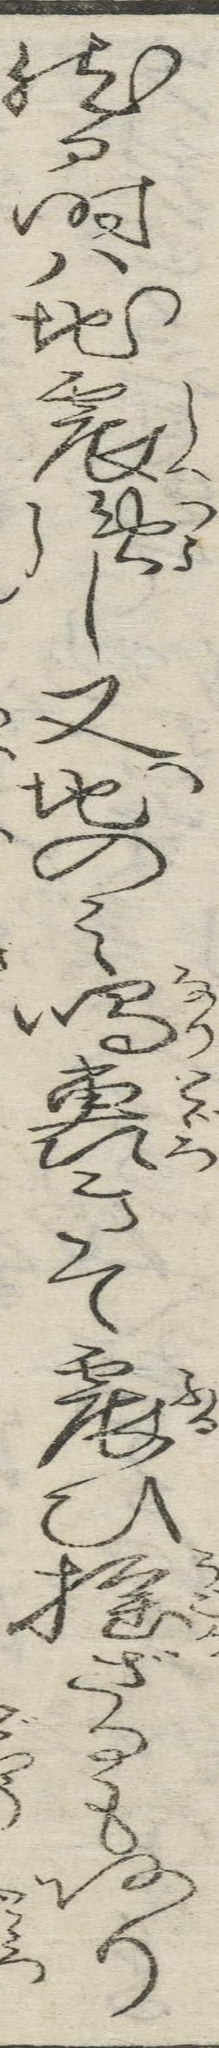然る時は地震強し又地のみ鳴軣きて震ひ揺ざるもあり
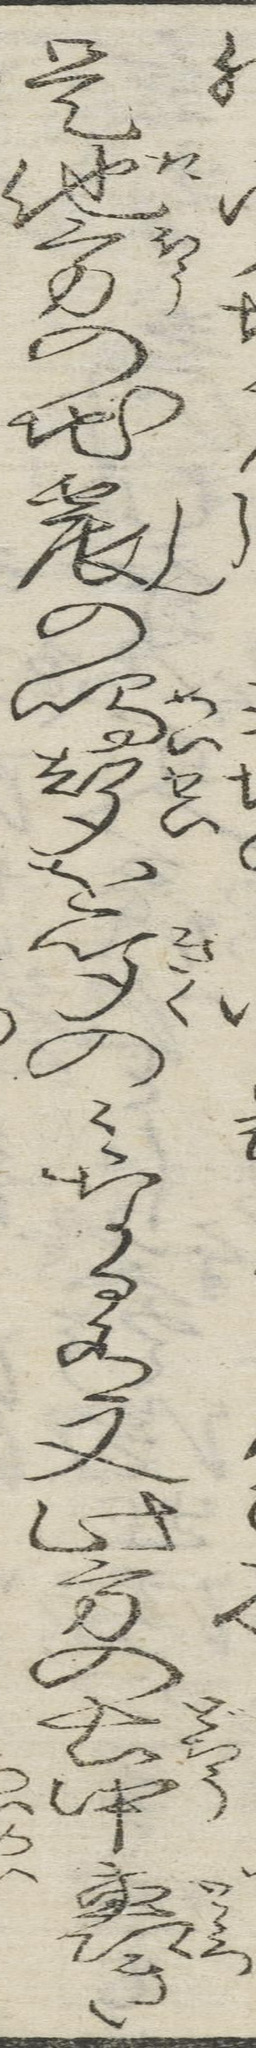是他方の地震の鳴声を聞のみなる有又此方の土中軣き
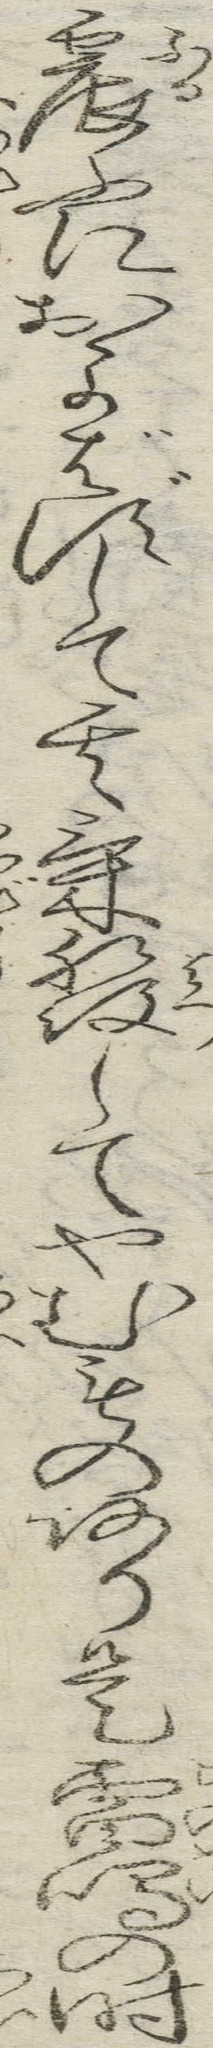震ふにおよばずして其気発してやむものあり是雷鳴の時
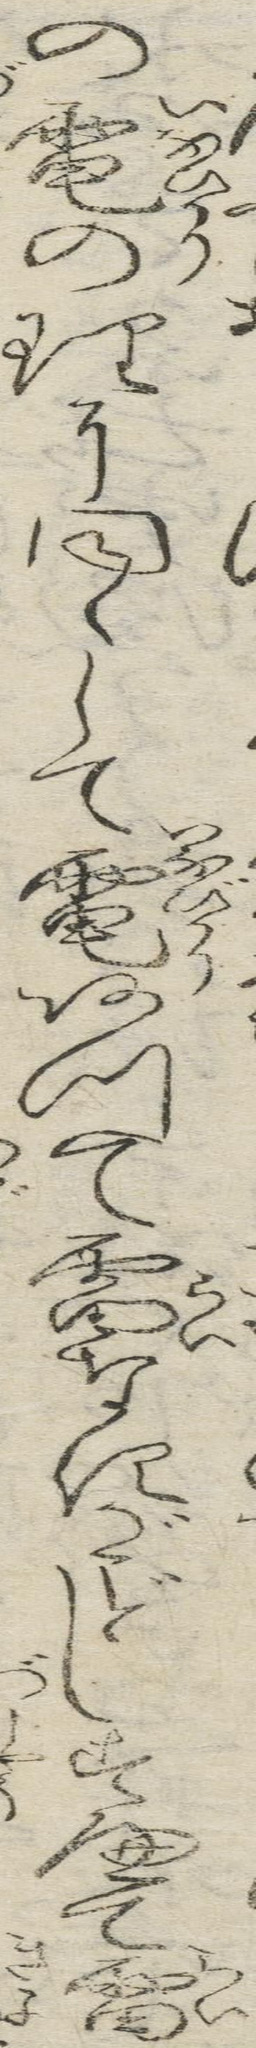の雷の理に同くして雷あつて雷なきがごとしすへて雷
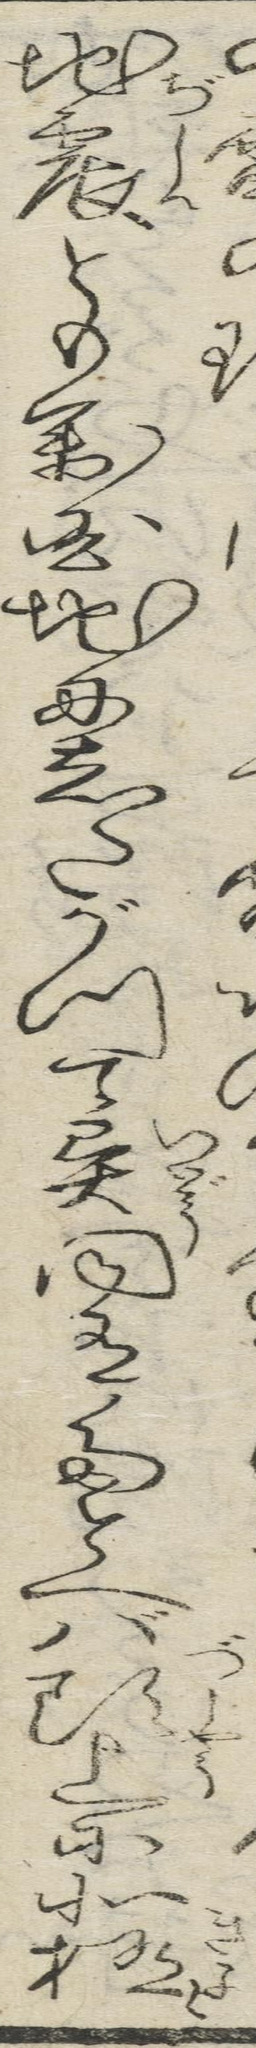地震ともみ国地にしたがつて異同有たとへば頭上に北極
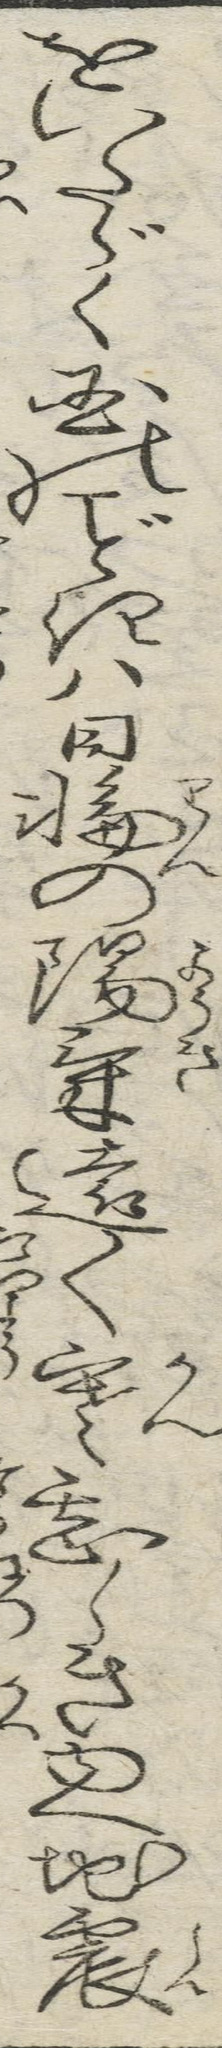をいたヾく国のごときは日輪の陽気遠く寒悪しきゆへ地震
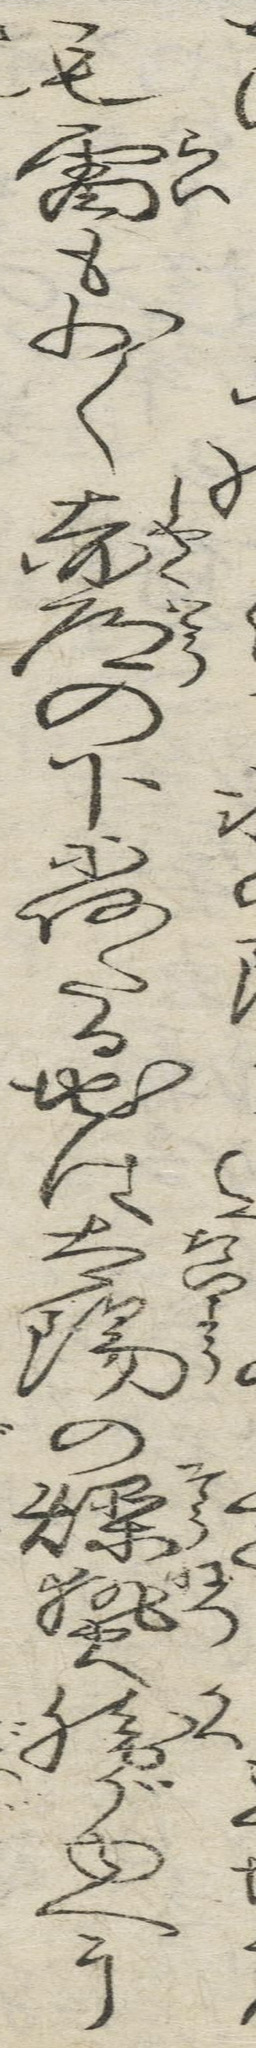も雷も少〳〵赤道の下にあたる地は太陽の燥熱勝がゆへに
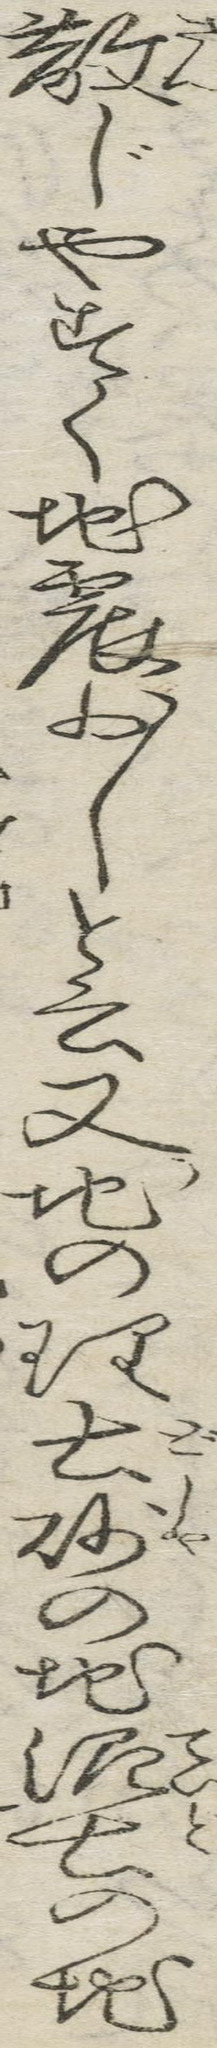散じやすく地震少〳〵と云又地の理土砂の地泥土の地
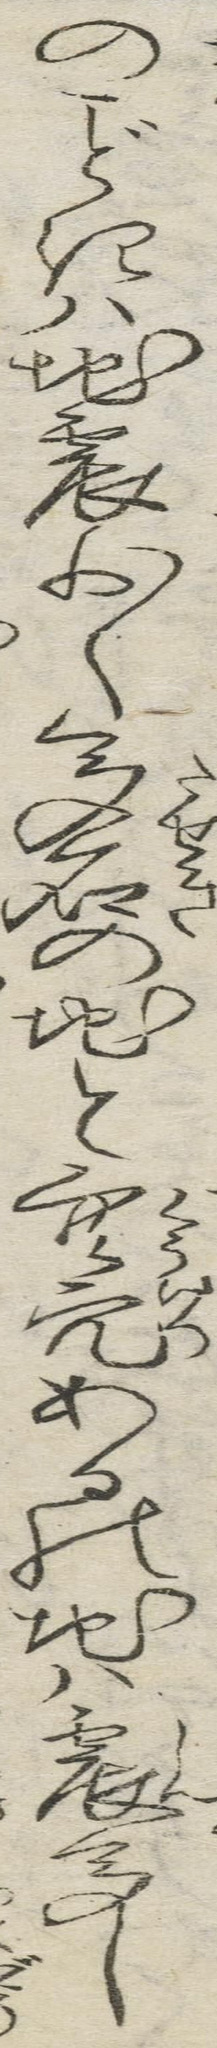のごときは地震少〳〵多石の地と穿穴あるの地は震多し
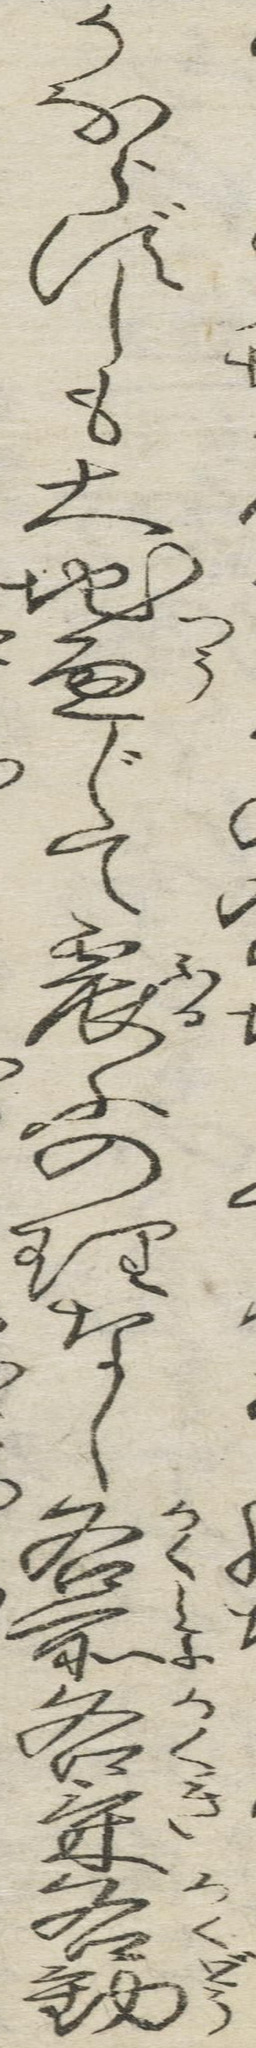かならずしも土地通じて震ふの理なし各所各気各動
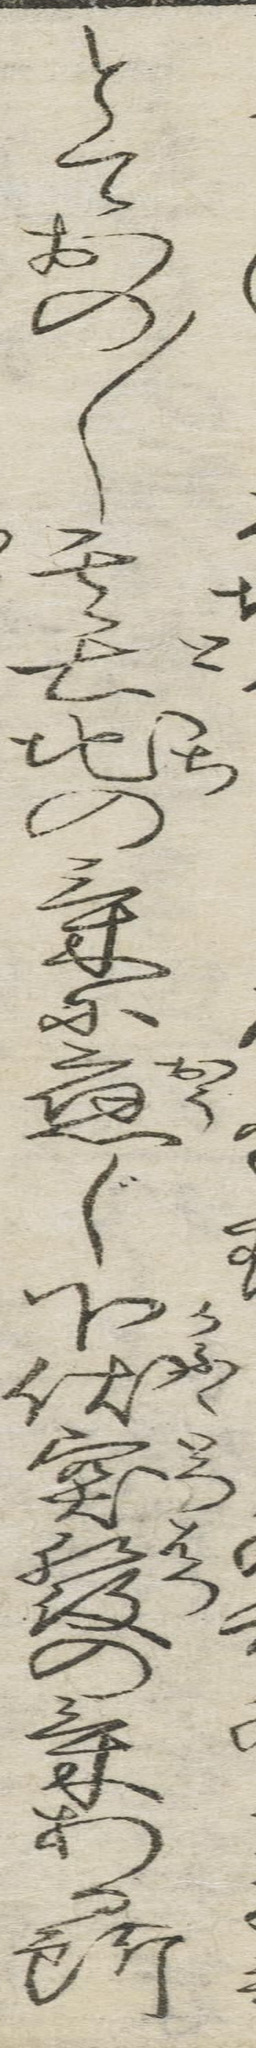とておの〳〵其土地の気に応じ下伏突発の気ある所
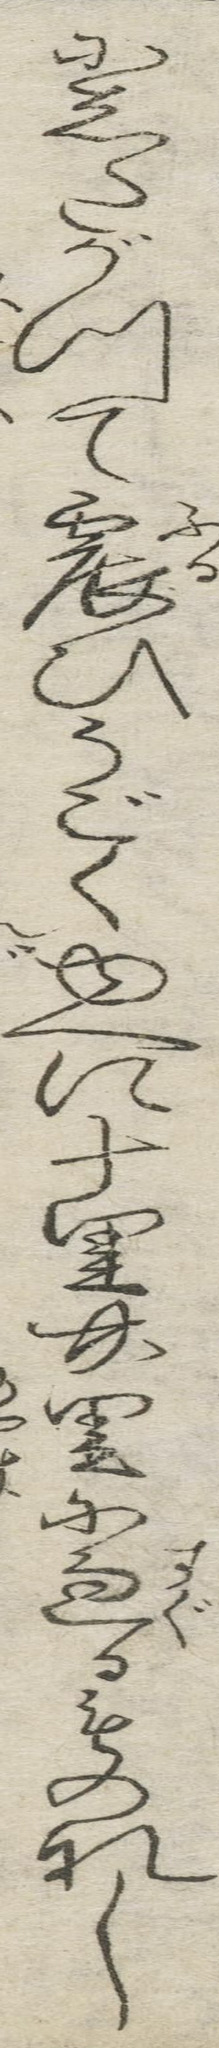にしたがつて震ひうごくゆへに十里廿里に過るものなし
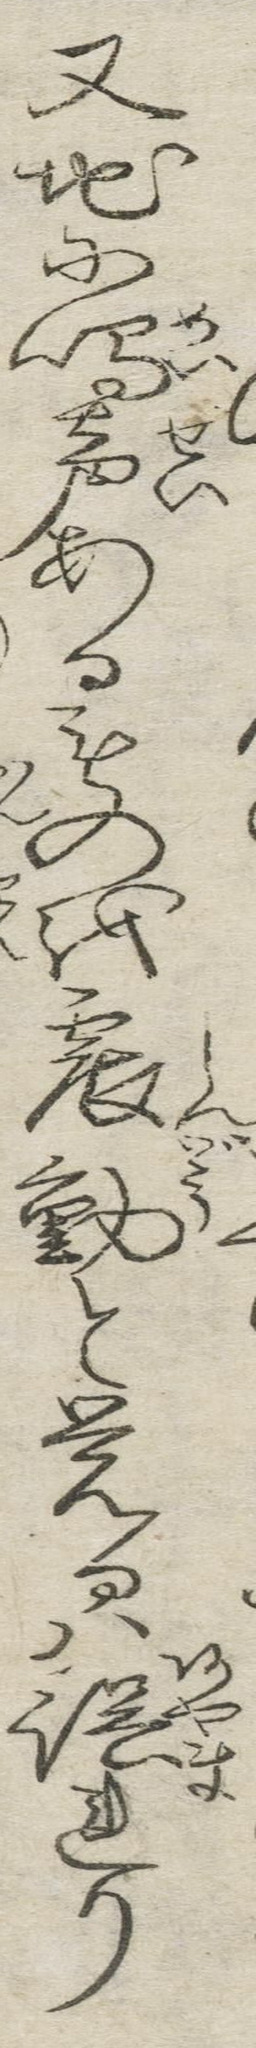又地に鳴声あるものを震動と答へるは誤れり
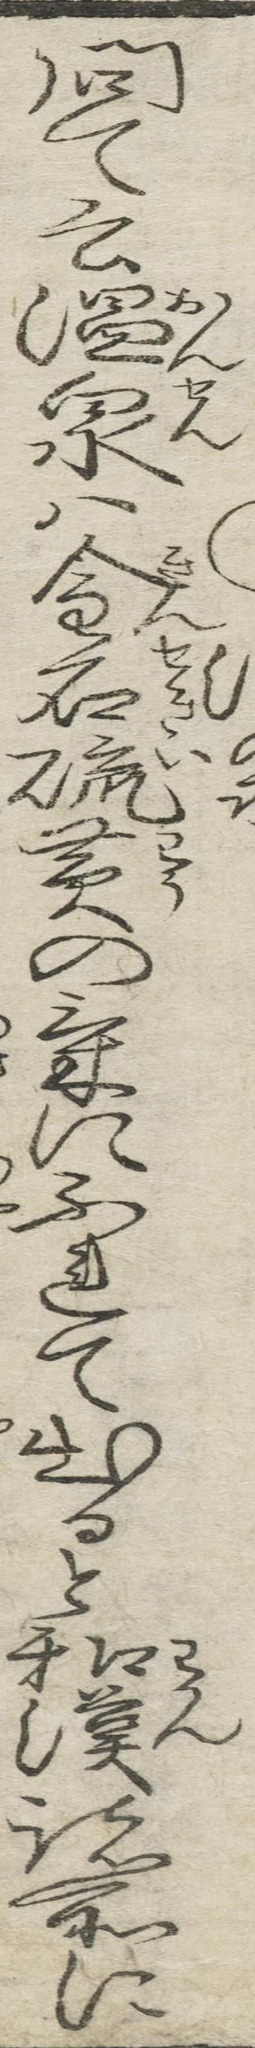問て云温泉は金石硫黄の気にふれて出ると和漢諸家に
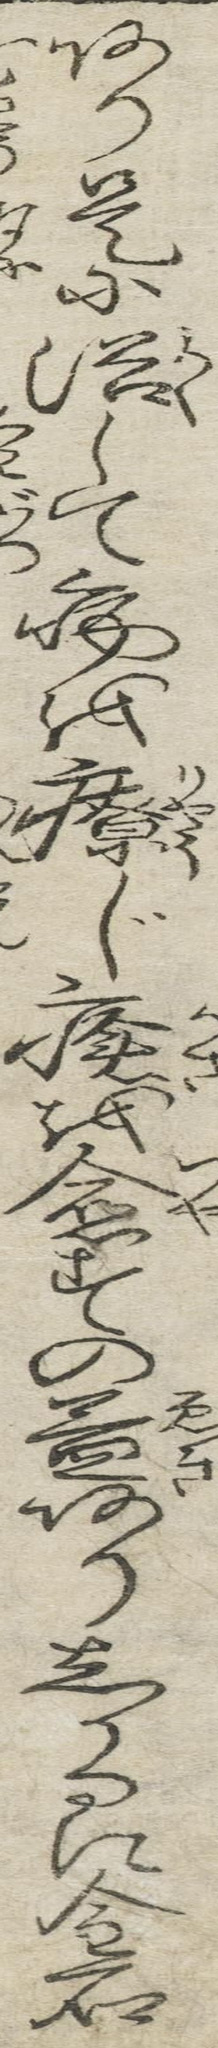あり是に浴して病を療じ瘡を癒すの益ありしかるに金石
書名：訓蒙天地辨　地
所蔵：東京大学地震研究所図書室 Earthquake Research Institute Library, The University of Tokyo, JAPAN
